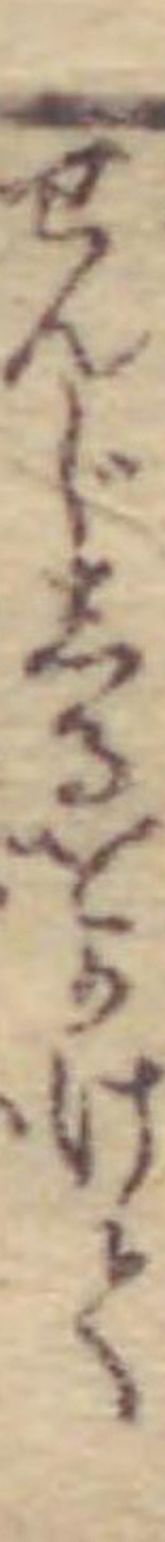せんじしるをかけて
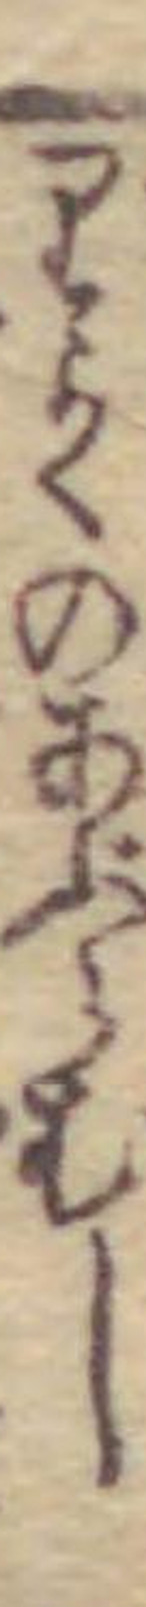りよくのあぶらむし
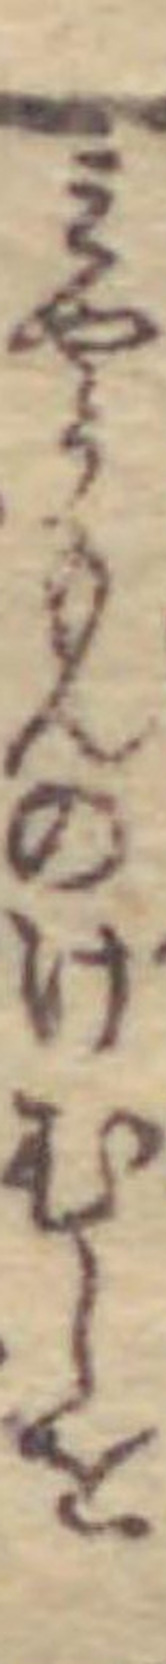みやうもんのけむしを
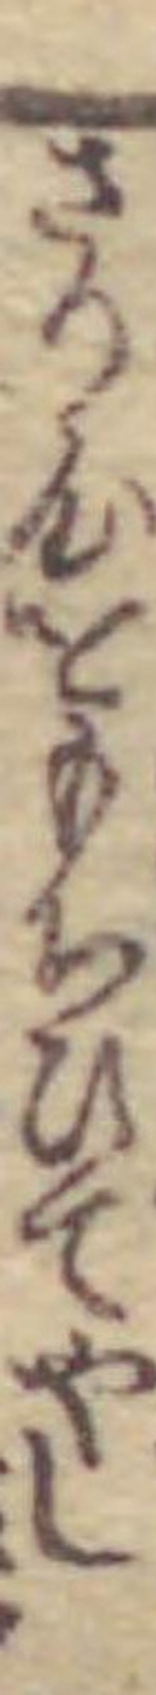さり心をもちひてやし
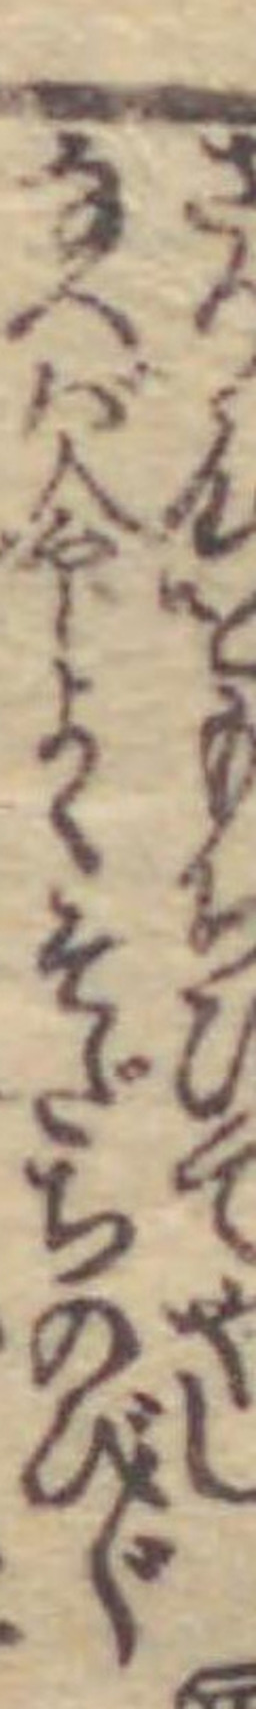なへば命よくそだちのび〴〵
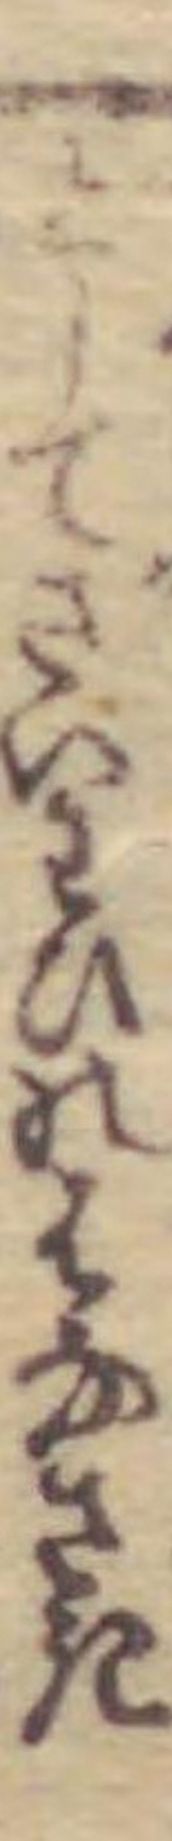としてさいわひのはなさき
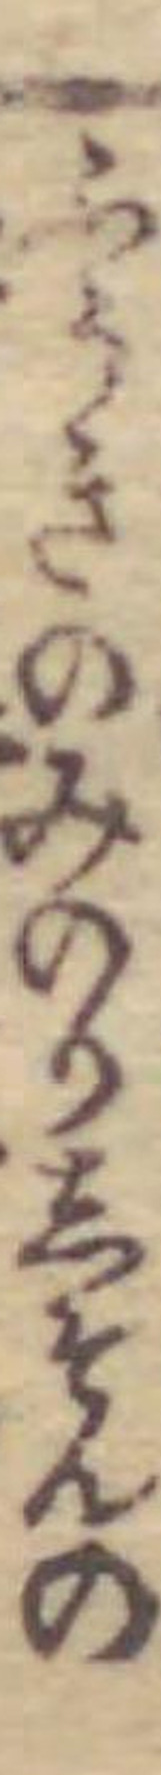ふうきのみのりしそんの
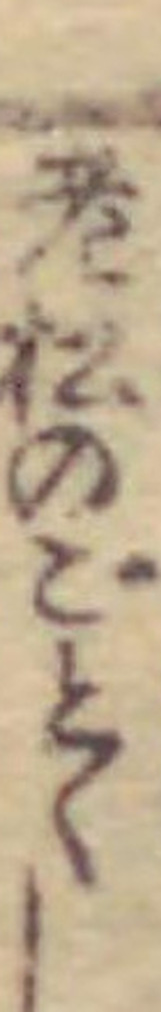老松のごとく
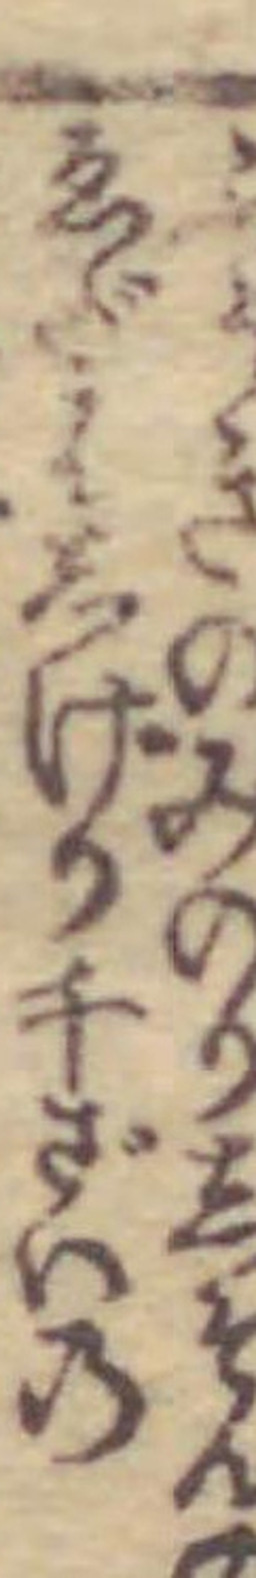ゑだはしげり千ざいの
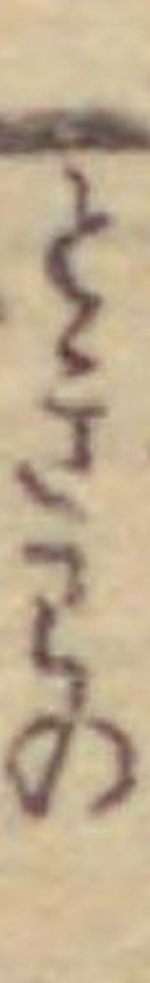ときわの
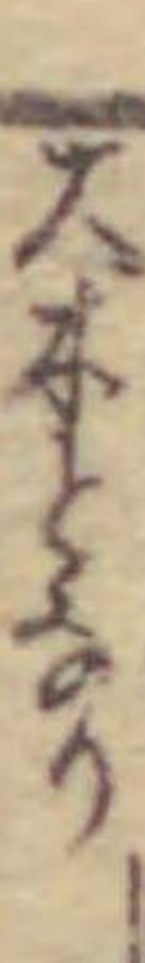大木となり
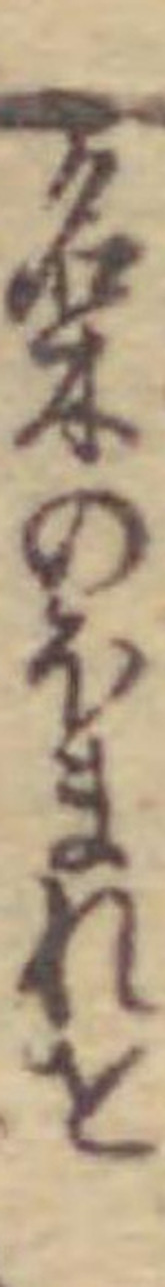名木のほまれを
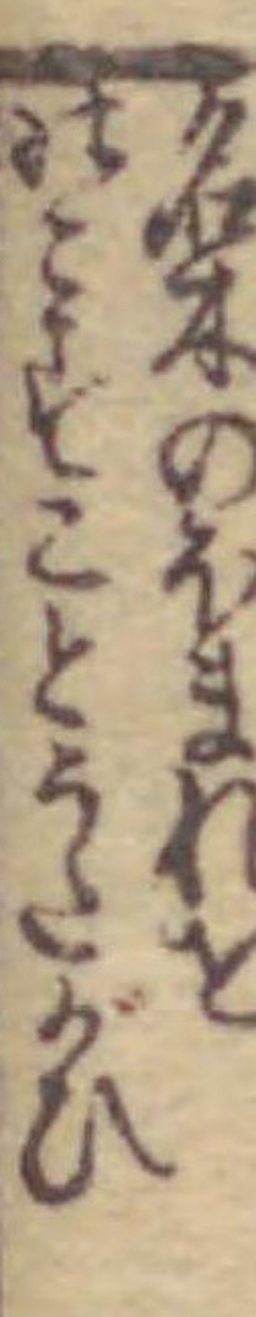のこすことうたがひ
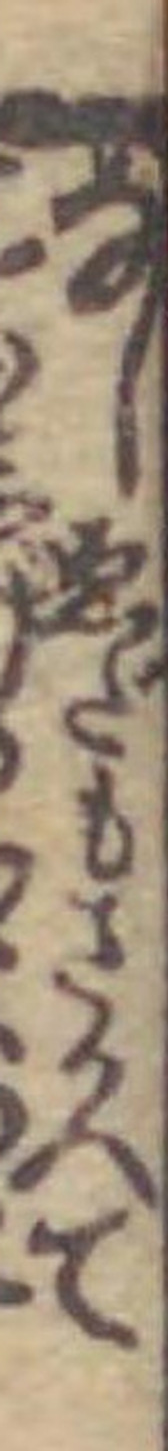なしゑだもさかへて
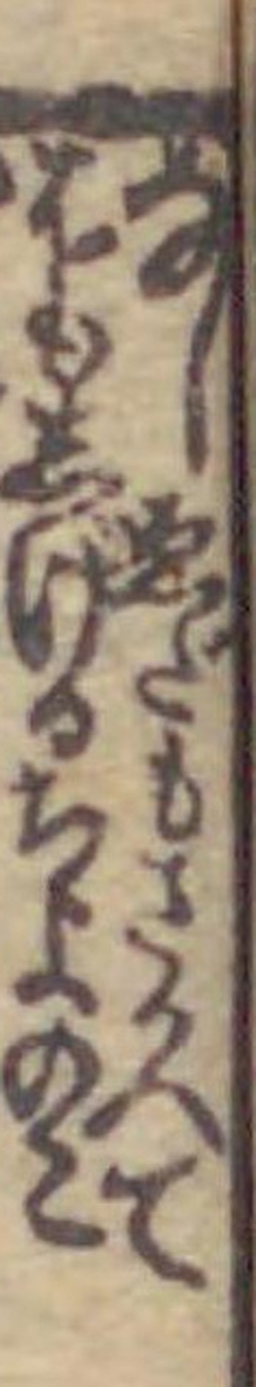はもしげるちよのこ
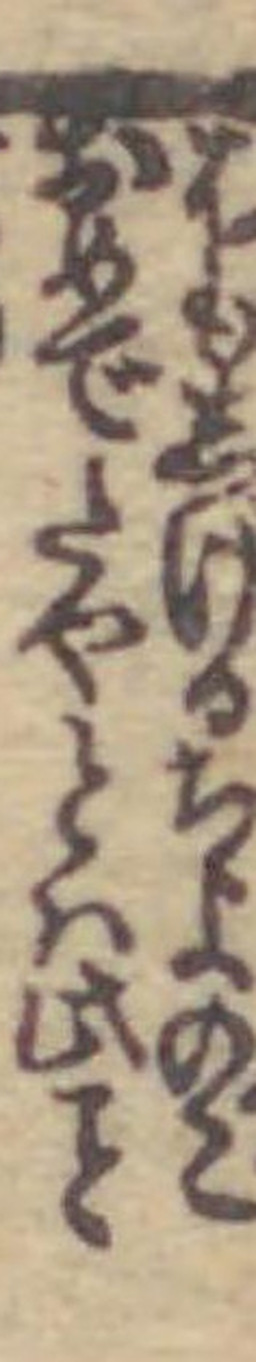おめでたやとは此こと
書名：御誂染長寿小紋 : 3巻
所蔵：国立国会図書館 National Diet Library, JAPAN
